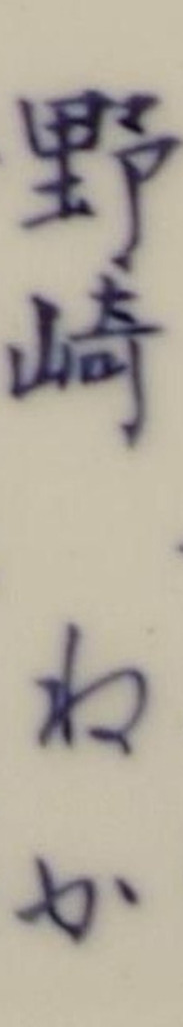野崎ねか
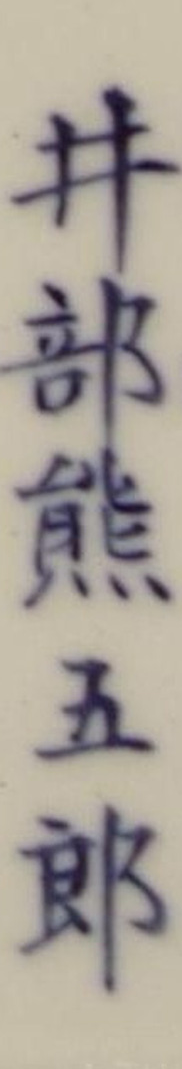井部熊五郎
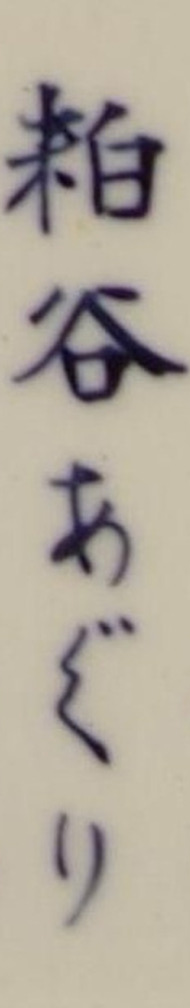粕谷あぐり
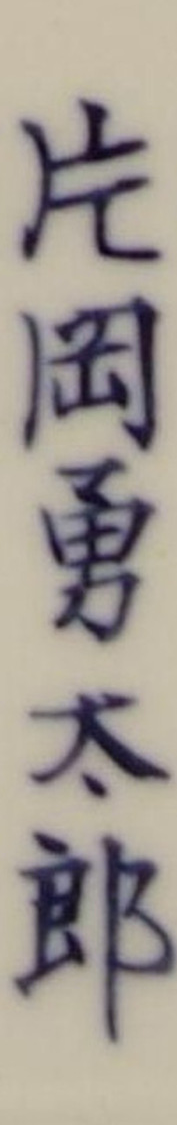片岡勇太郎
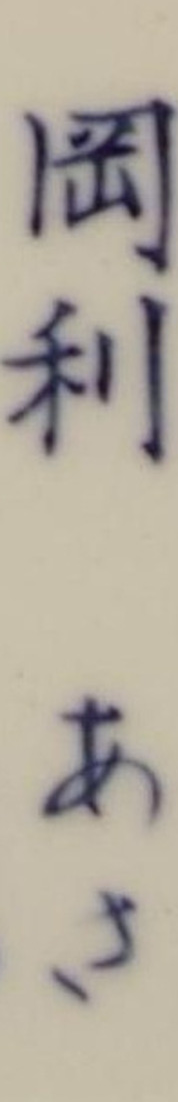岡利あさ
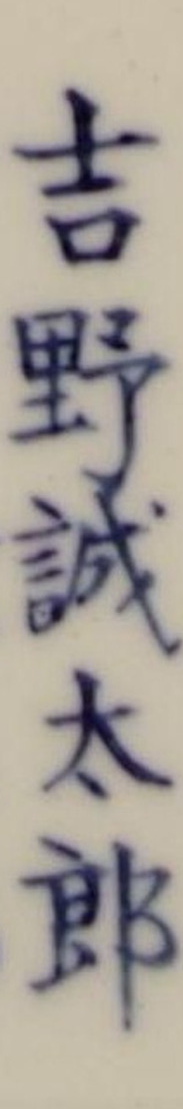吉野誠太郎
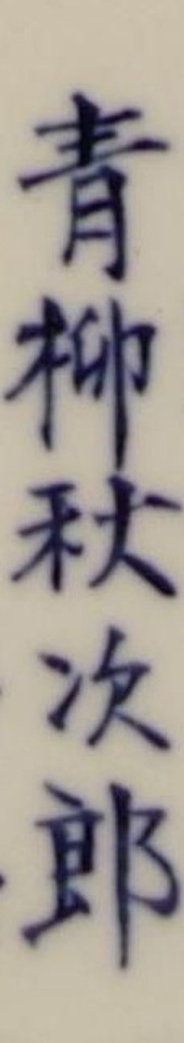青柳秋次郎
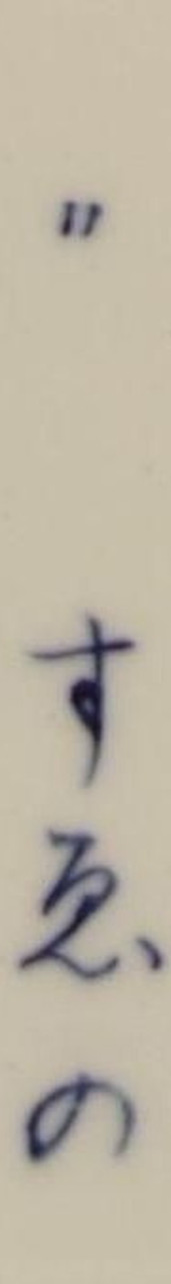すえの
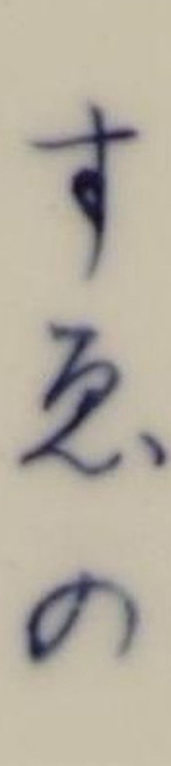すえの
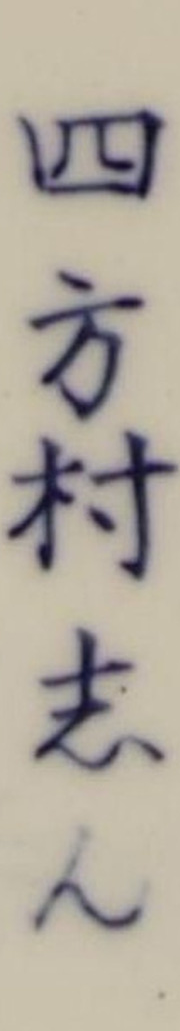四方村しん
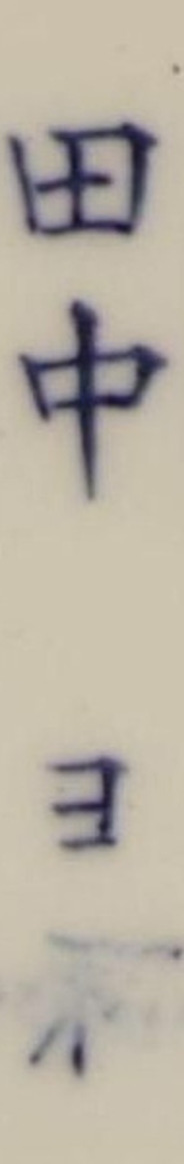田中ヨネ
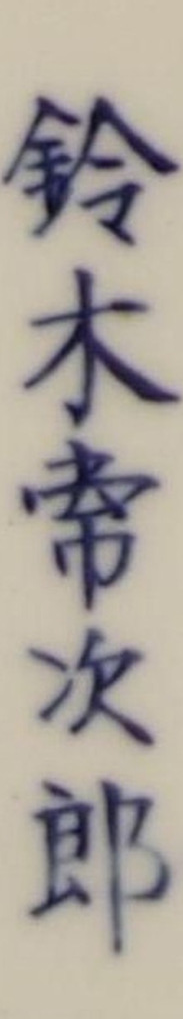鈴木常次郎
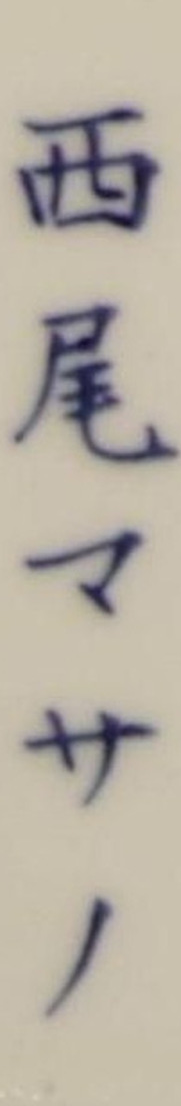西尾マサノ

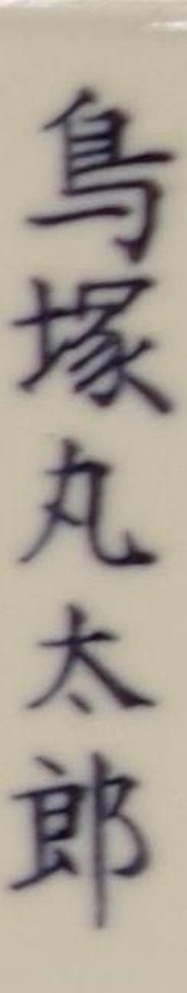鳥塚丸太郎
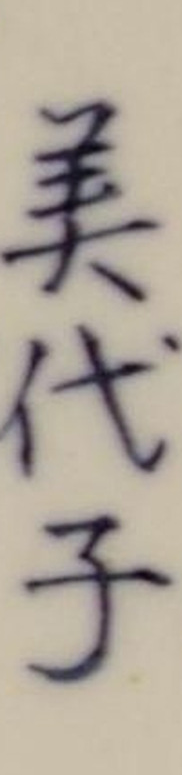美代子
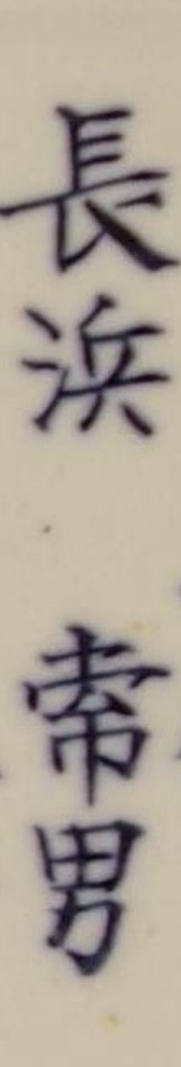長浜常男
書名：E~L
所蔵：高野山金剛峯寺
